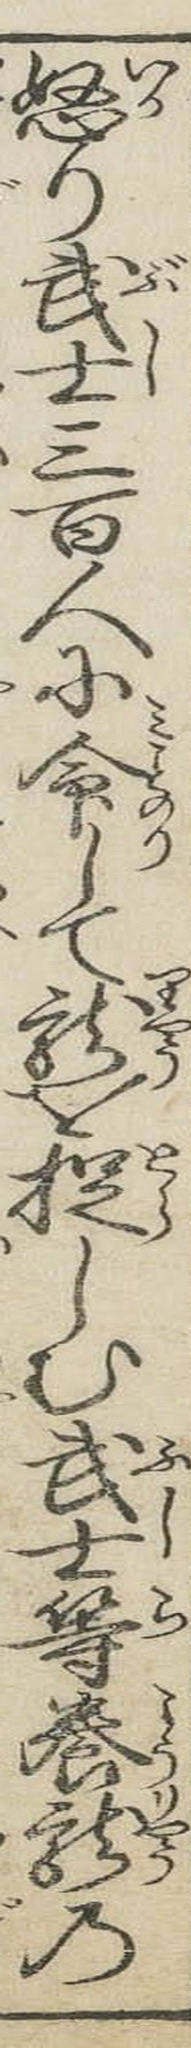怒り武士三百人に命して竜を捉しむ武士等養竜の
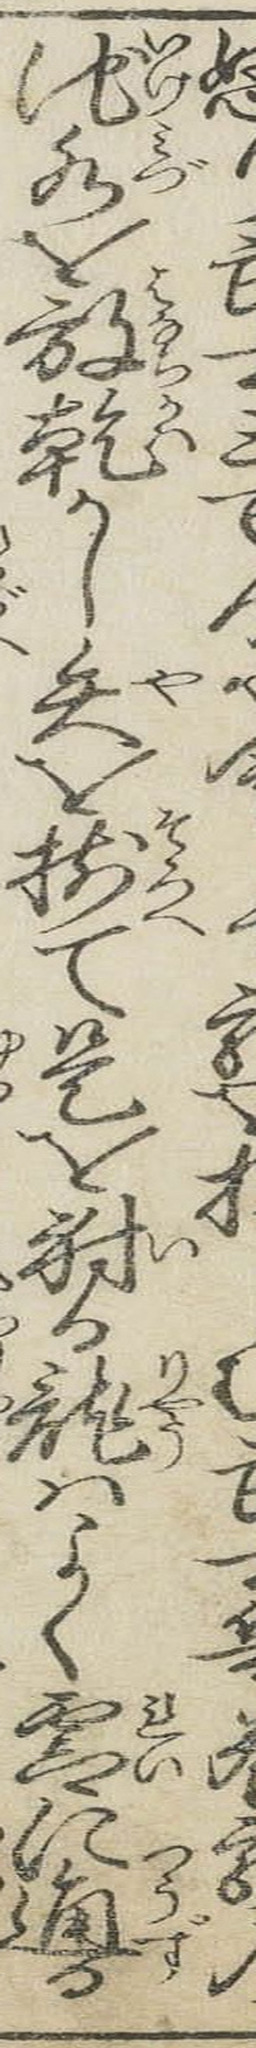池水を放乾かし矢を揃て是を射る竜はよく霊に通る
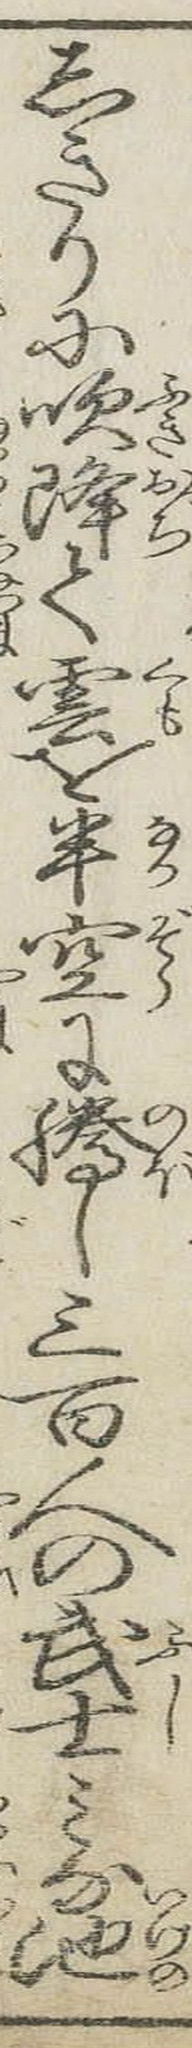しきりに吹降て雲を半空に騰し三百人の武士みな池
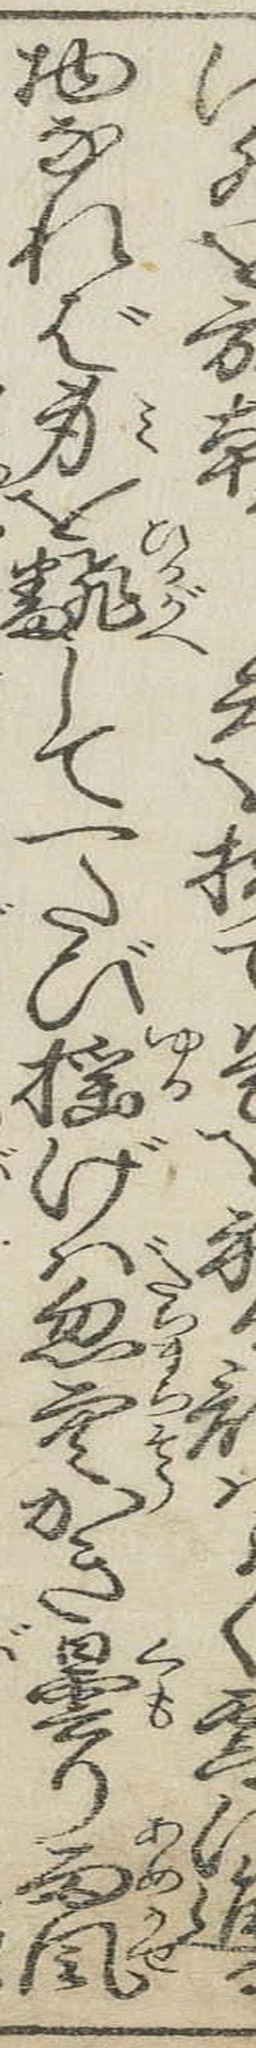物なれば身を飜して一たび揺げば忽空かき曇り雨風
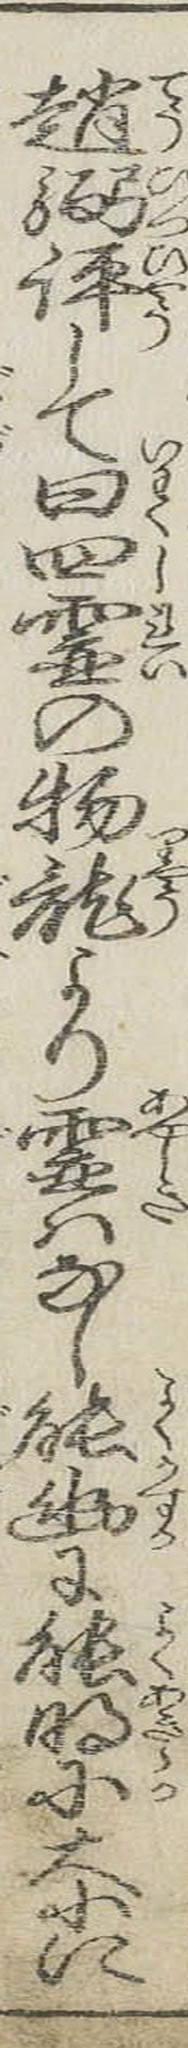趙弼評して曰四霊の物竜より霊はなし能幽に能明に大小に
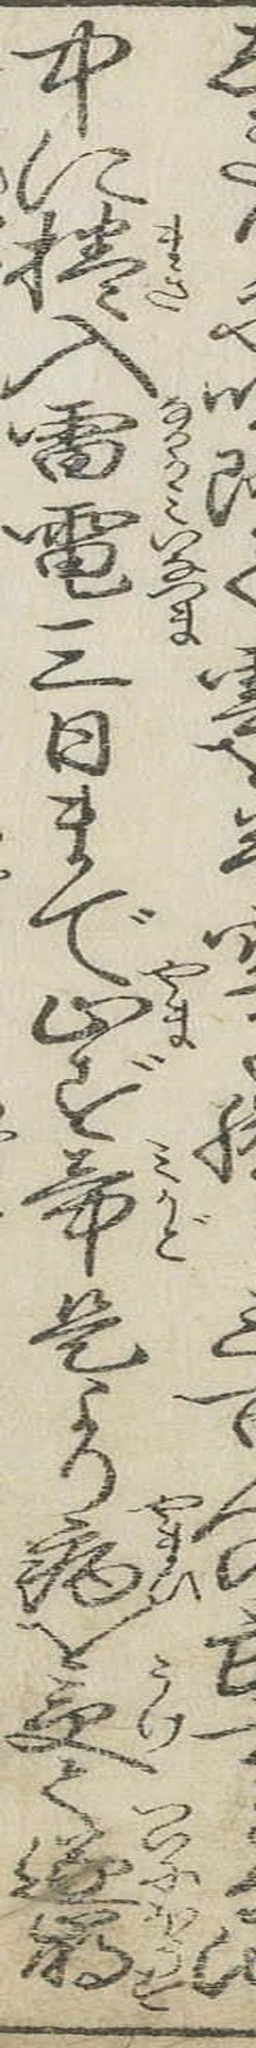中に捲入雷電三日まで止ず帝是より病を受て遂崩
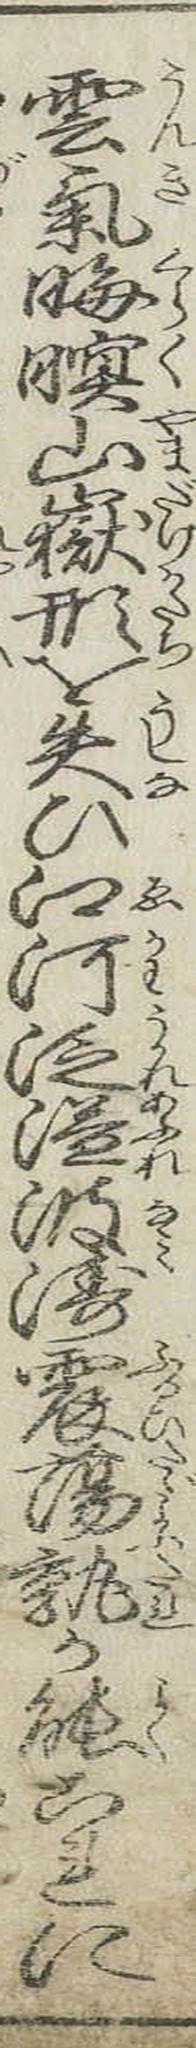雲気晦瞑山嶽形を失ひ江河泛溢波涛震蕩孰か能これに
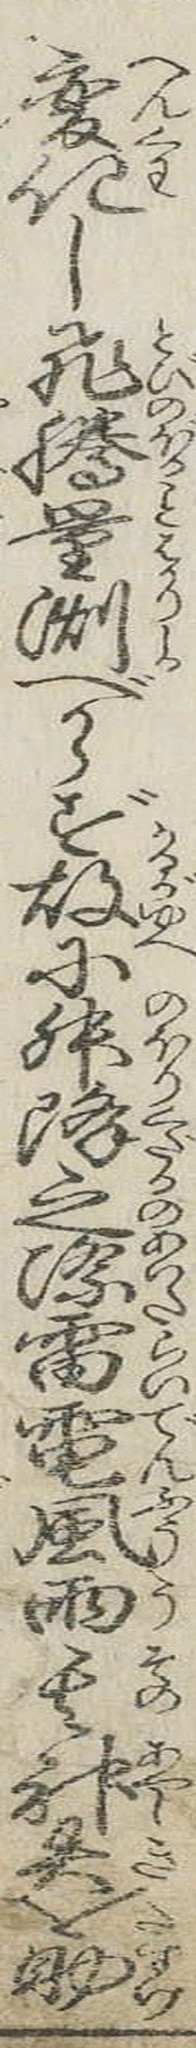変化し飛騰量測べからず故に升降之際雷電風雨其神異を助
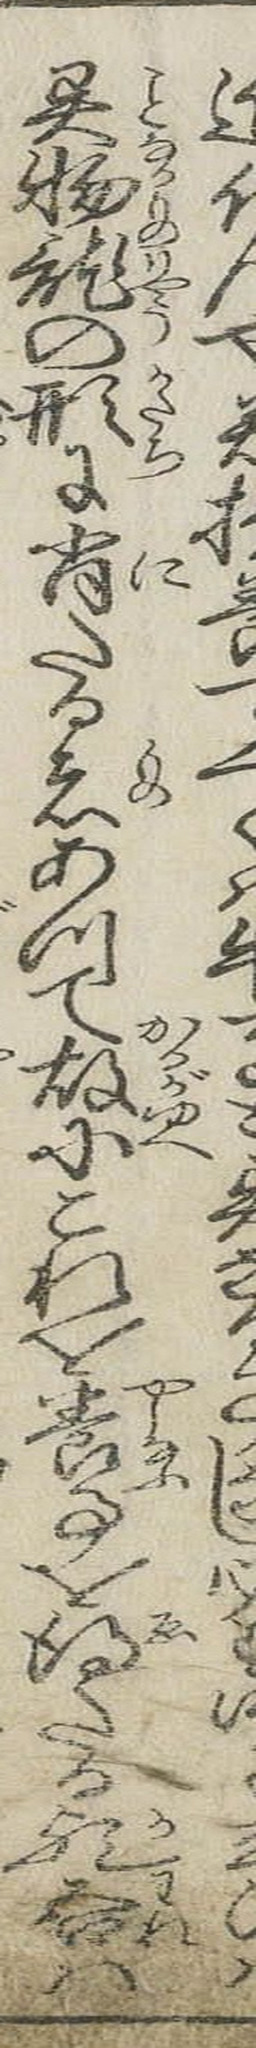異物竜の形に肖たる者あつて故にこれを養事を得たる歟吾は
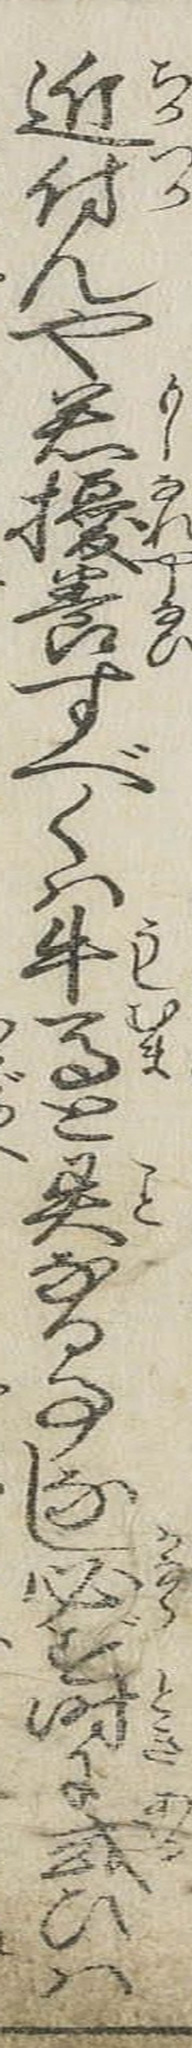近付んや若擾養すべくは牛馬と異なる事なし必ず時に或ひは
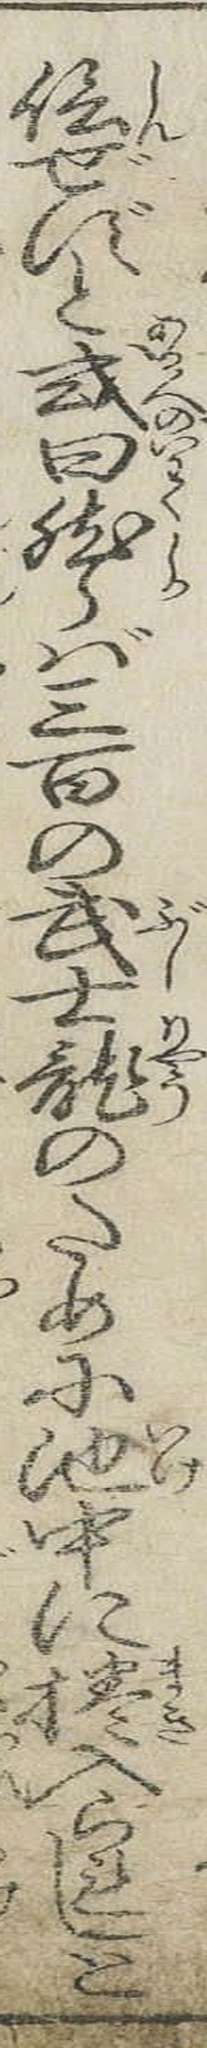信ぜずと或曰然らば三百の武士竜のために池中に捲入られしと
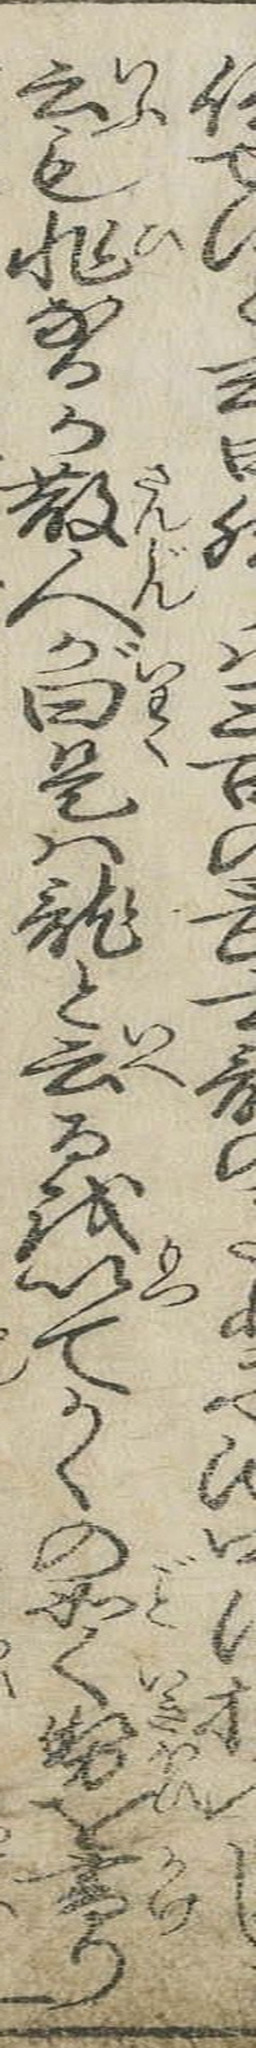云も非なるか散人が曰是は竜と云るを以てかくの如く勢を書り
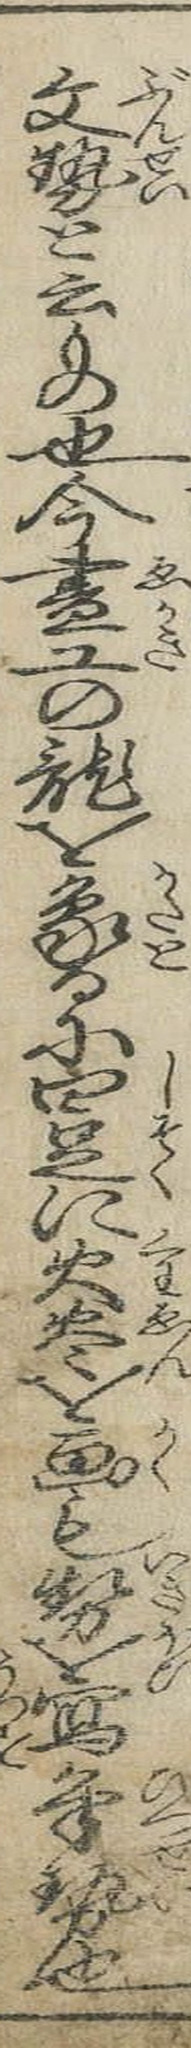文勢と云もの也今画工の竜を象るに四足に火炎を画も勢を写筆勢也

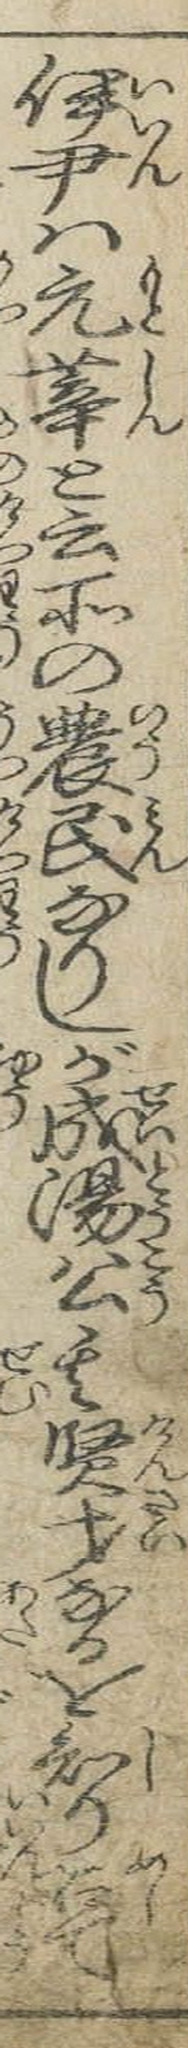伊尹は元莘と云所の農民なりしが成湯公其賢才なるを知り召て
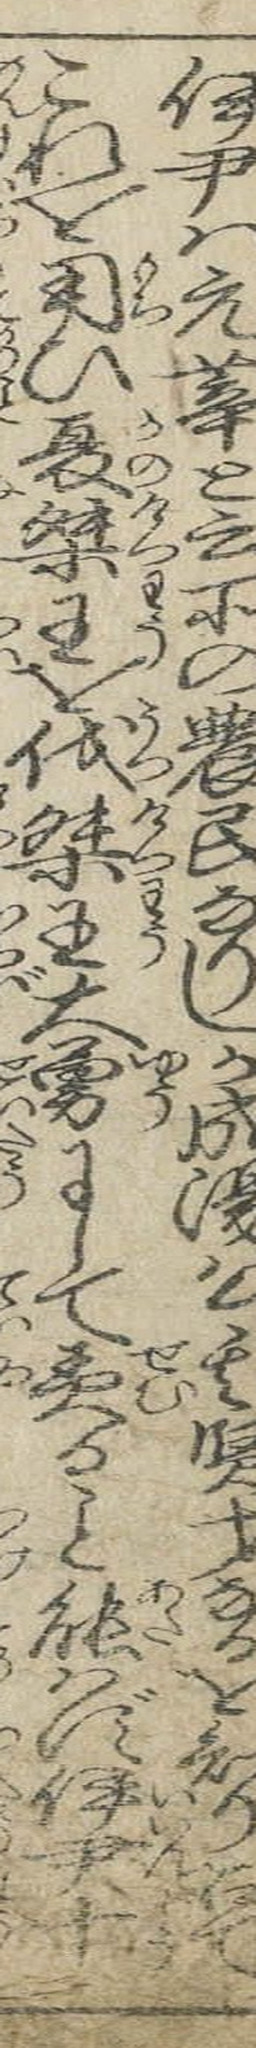これを用ひ夏桀王を伐桀王大勇にして責ること能はず伊尹十
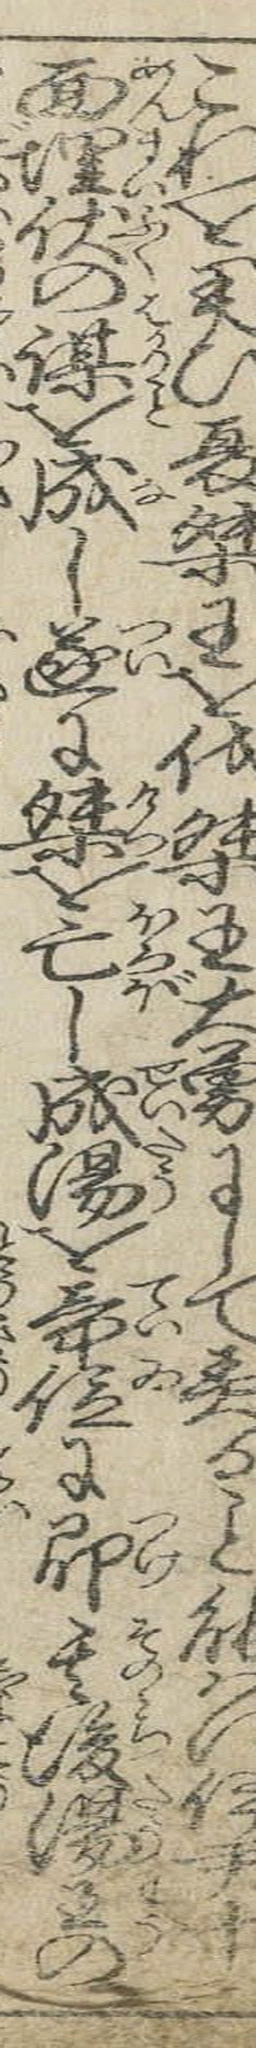面埋伏の謀を成し遂に桀を亡し成湯を帝位に即其後湯王の
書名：絵本写宝袋 9巻 4之巻
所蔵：東京学芸大学教育コンテンツアーカイブ
